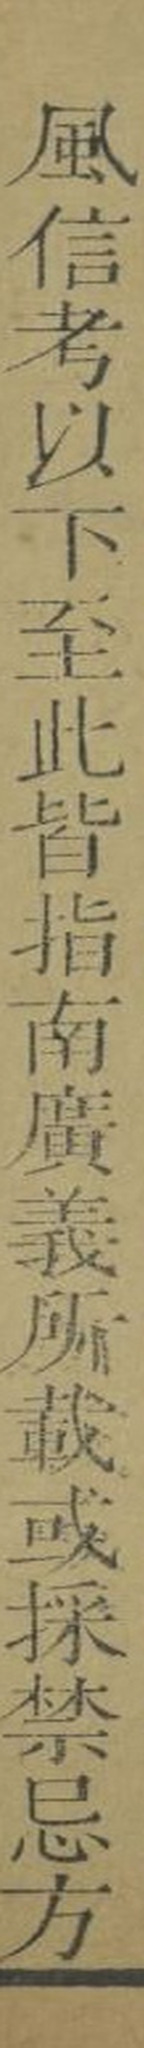風信考以下至此皆指南廣義所載或採禁忌方
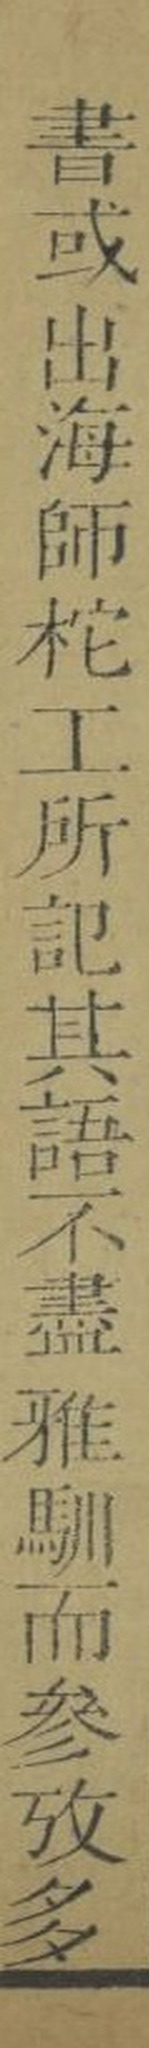書或出海師柁工所記其語不盡雅馴而參攷多
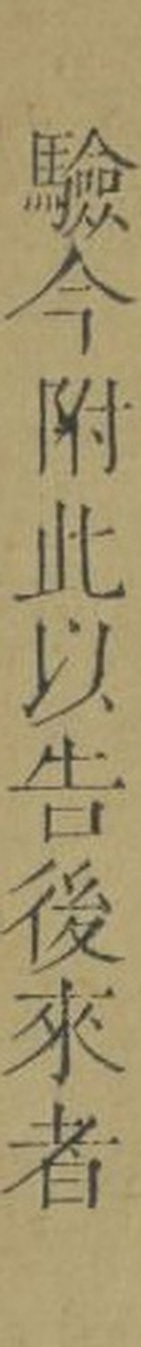驗今附此以告後來者

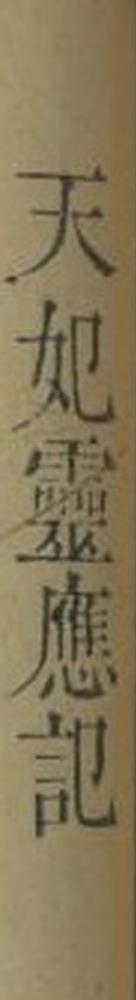天妃靈應記
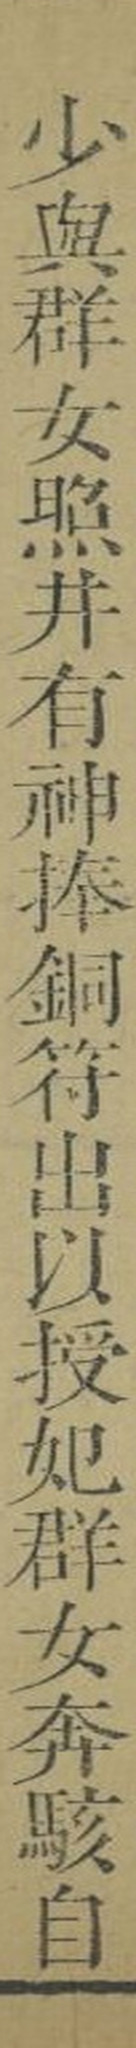少與群女照井有神捧銅符出以授妃群女奔駭自
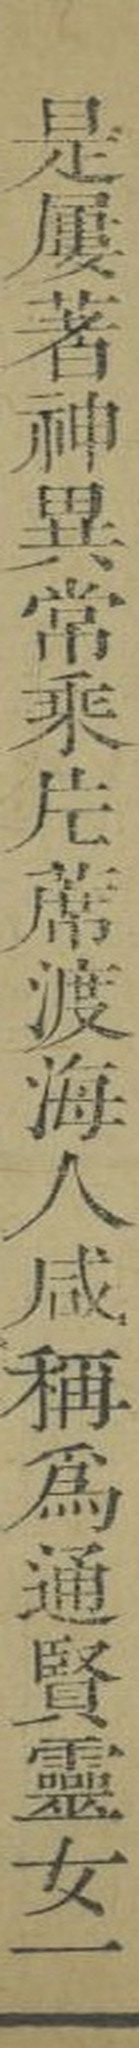是屢著神異常乘片蓆渡海人咸稱爲通賢靈女一
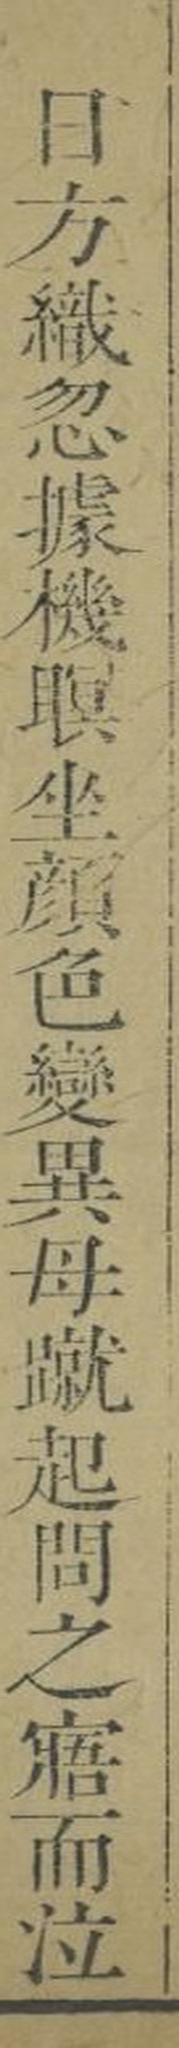日方織忽據機瞑坐顔色變異母蹴起問之寤而泣
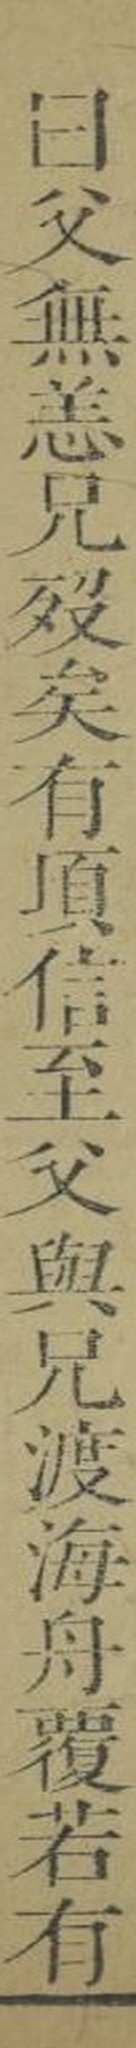曰父無恙兄歿矣有頃信至父與兄渡海舟覆若有
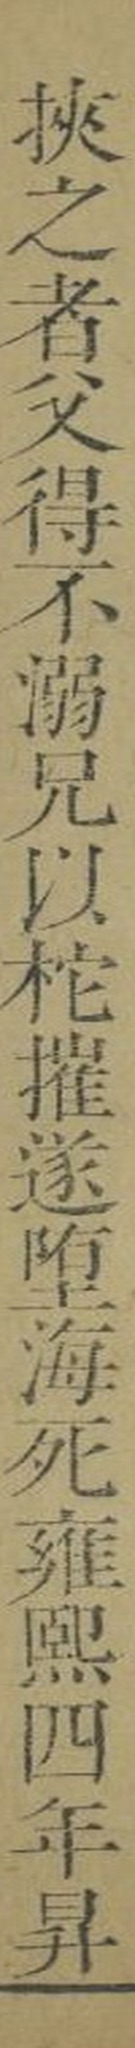挾之者父得不溺兄以柁摧遂堕海死雍熙四年昇

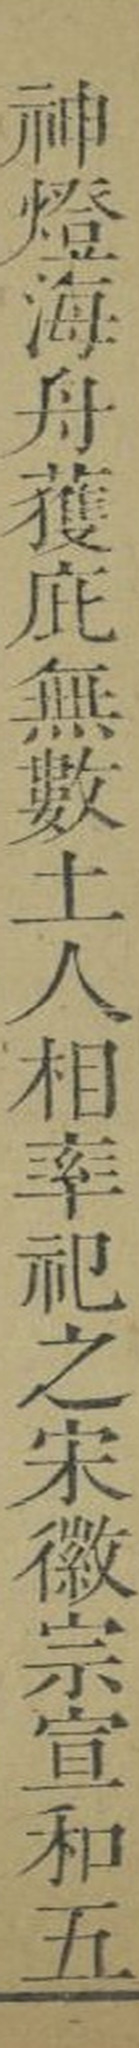神燈海舟獲庇無數土人相率祀之宋徽宗宣和五
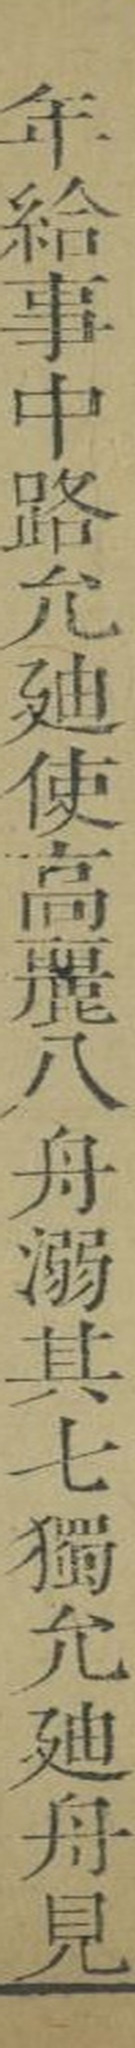年給事中路允廸使高麗八舟溺其七獨允廸舟見
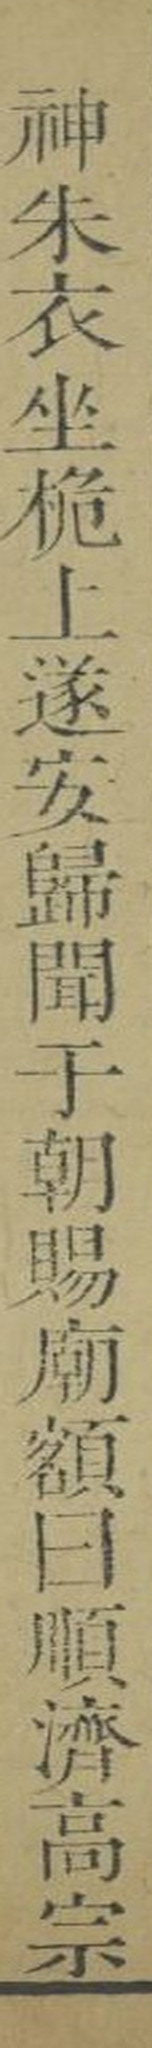神朱衣坐桅上遂安歸聞于朝賜廟額曰順濟高宗
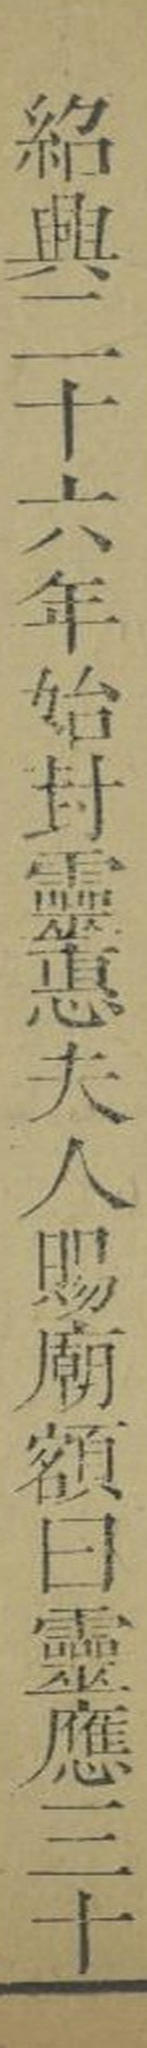紹興二十六年始封靈惠夫人賜廟額曰靈應三十
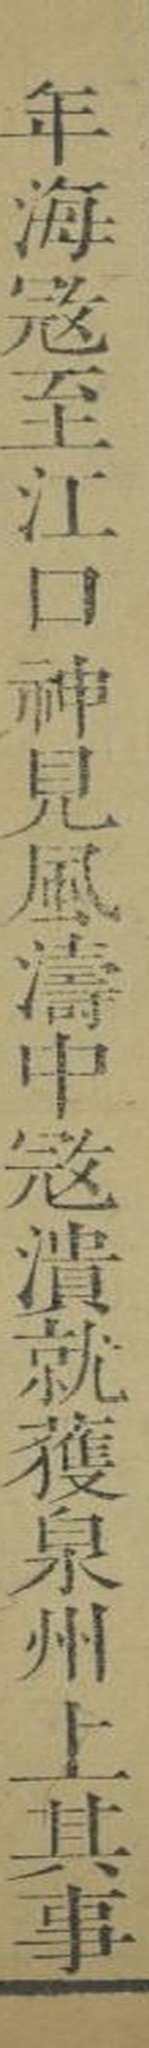年海冦至江口神見風濤中冦潰就獲泉州上其事
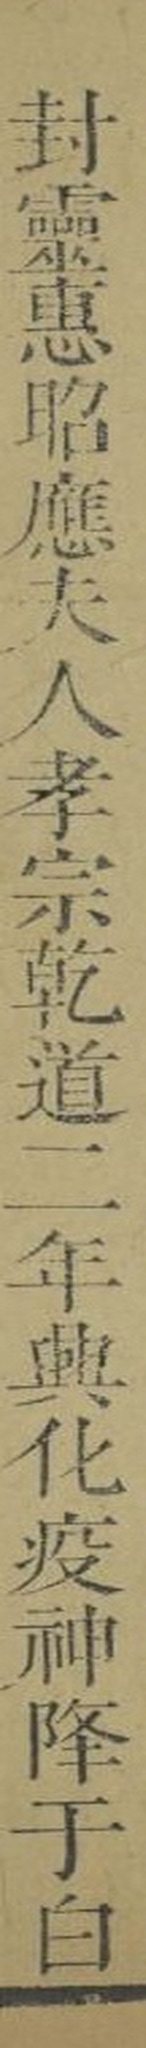封靈惠昭應夫人孝宗乾道二年興化疫神降于白
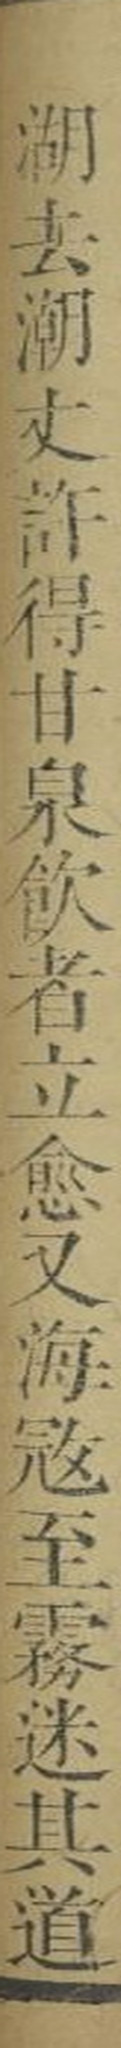湖去潮丈許得甘泉飮者立愈又海冦至霧迷其道
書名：中山伝信録 巻一
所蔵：University of the Ryukyus Library
